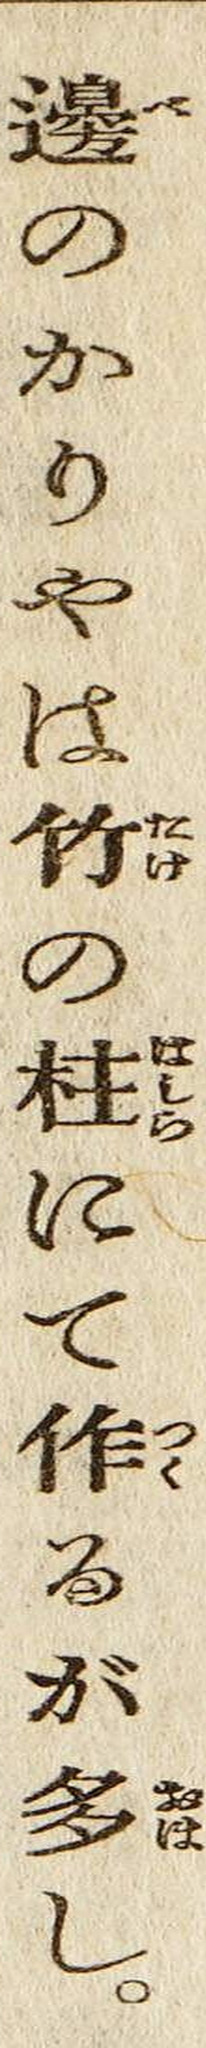辺のかりやは竹の柱にて作るが多し。
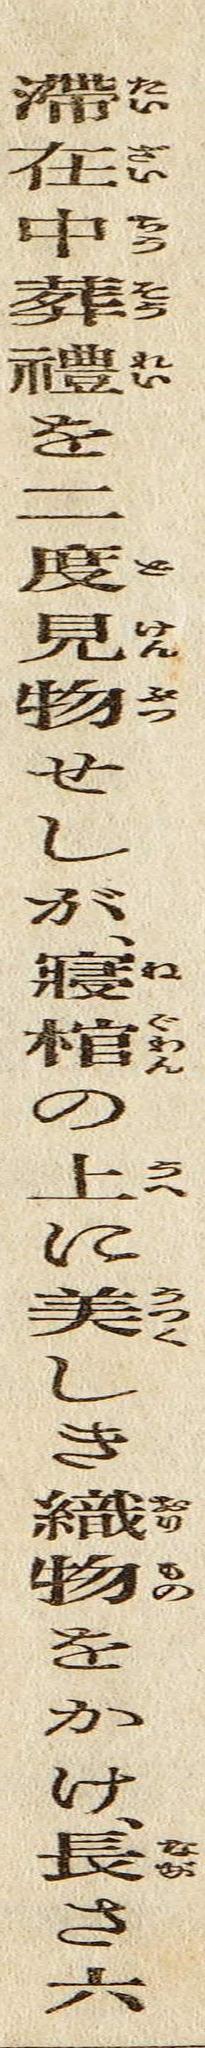滞在中葬礼を二度見物せしが、寝棺の上に美しき織物をかけ、長き六
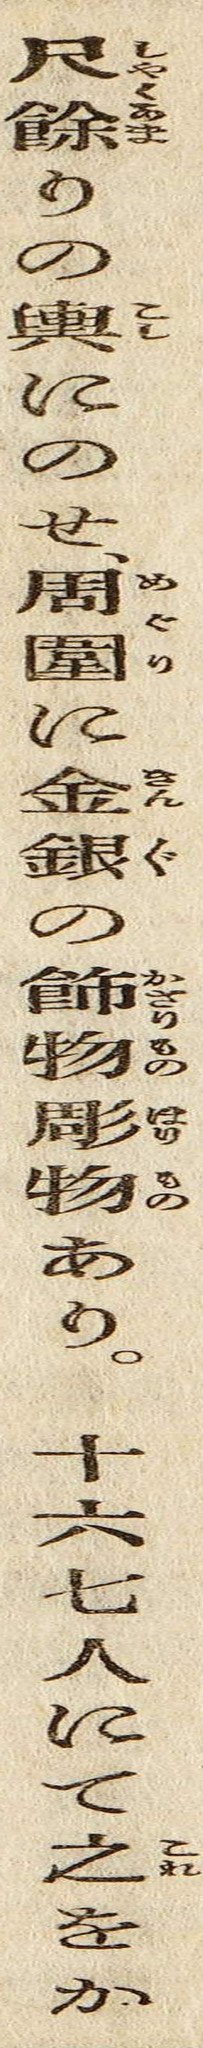尺余りの輿にのせ、周囲に金銀の飾物彫物あり。十六七人にて之をか
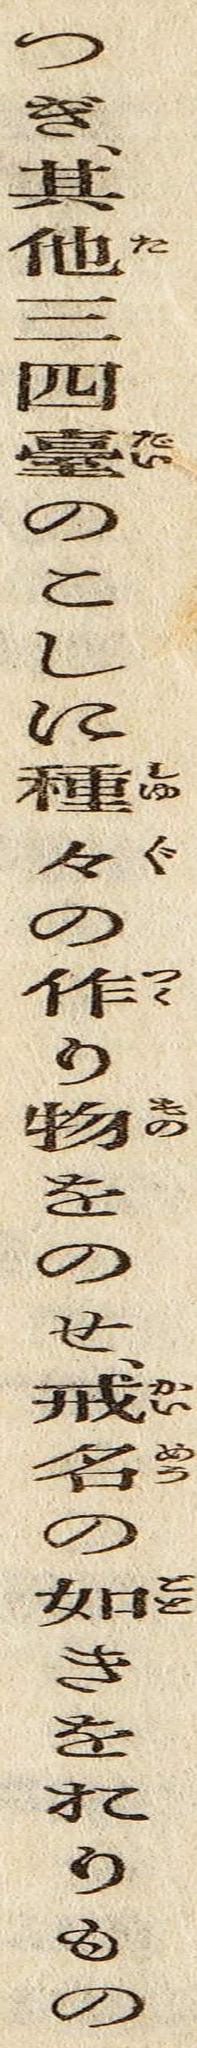つぎ、其他三四台のこしに種々の作り物をのせ、戒名の如きをおりもの
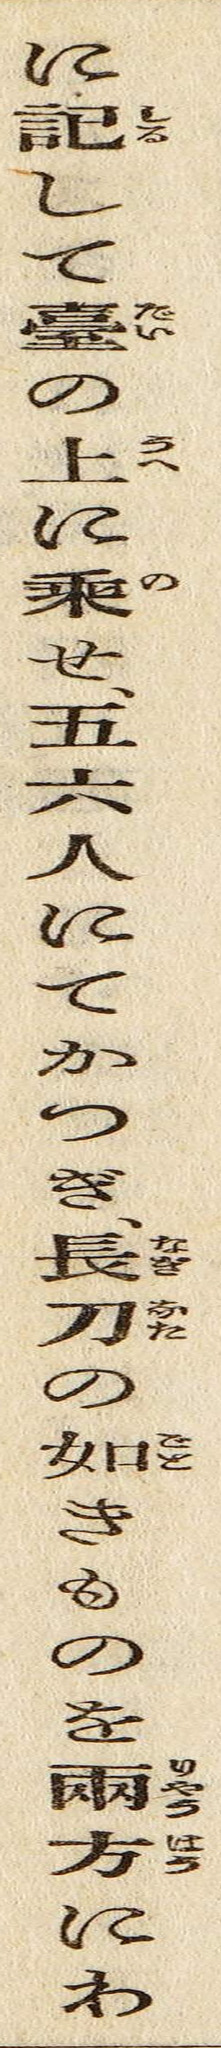に記して台の上に乗せ、五六人にてかつぎ、長刀の如きものを両方にわ
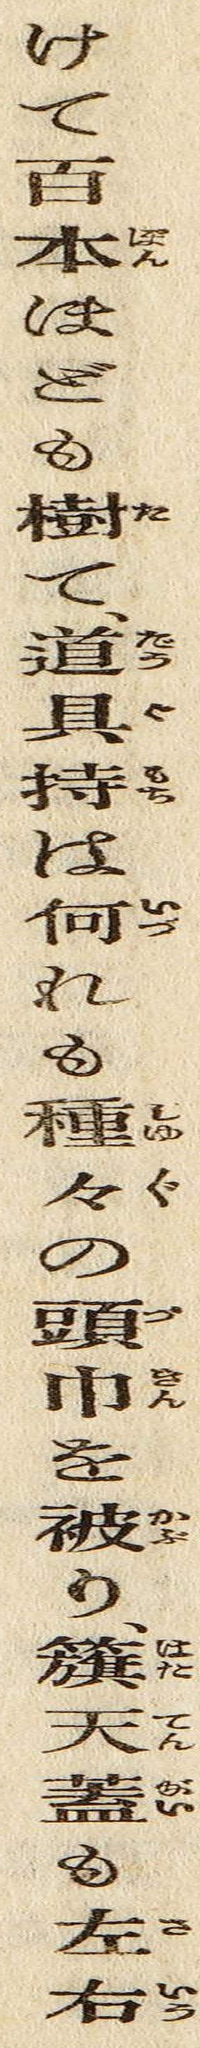けて百本ほども樹て、道具持は何れも種々の頭巾を被り、籏天蓋も左右
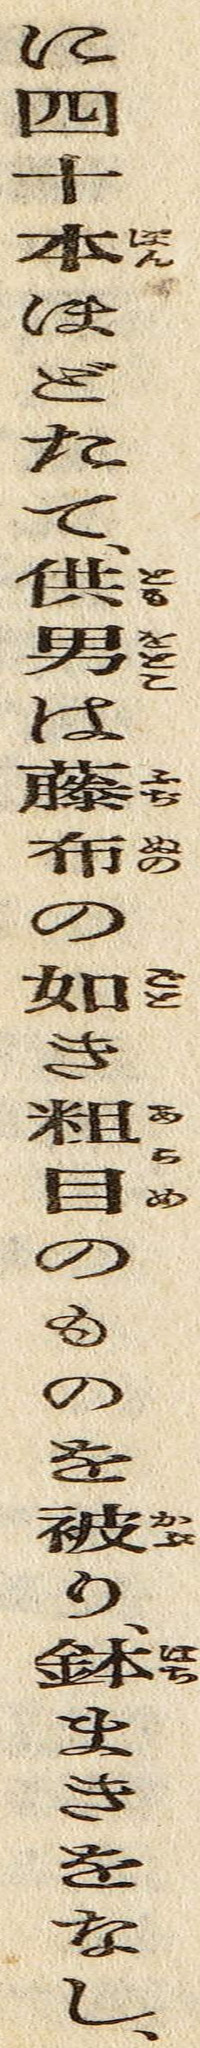に四十本ほどたて、供男は藤布の如き粗目のものを被り、鉢まきをなし、
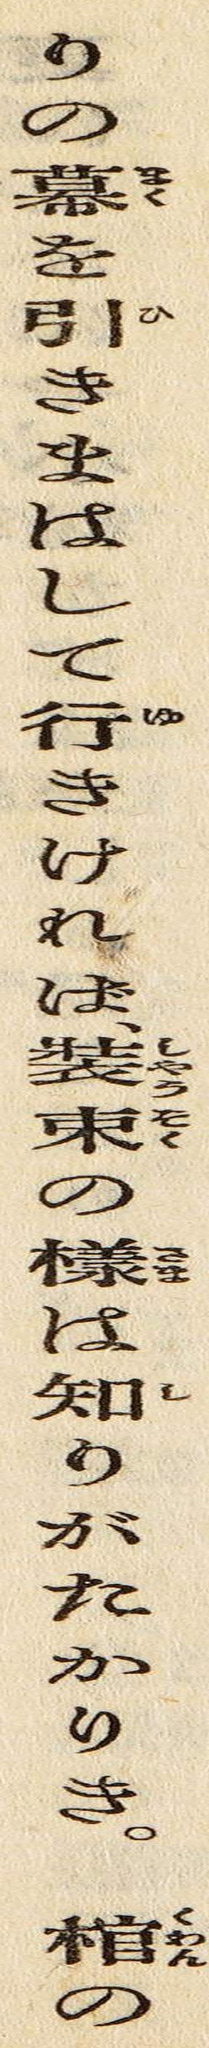りの幕を引きまはして行きければ、装束の様は知りがたかりき。棺の
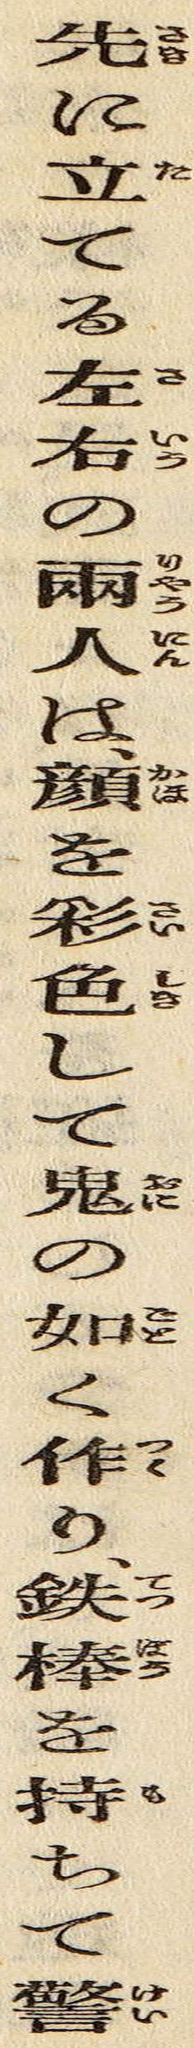先に立てる左右の両人は、顔を彩色して鬼の如く作り、鉄棒を持ちて警
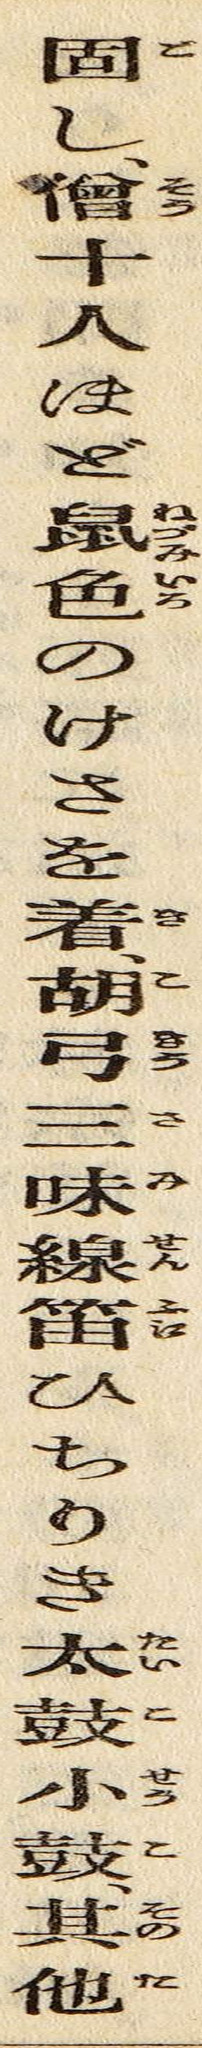固し、僧十人ほど鼠色のけさを着、胡弓三味線笛ひちりき太鼓小鼓、其他
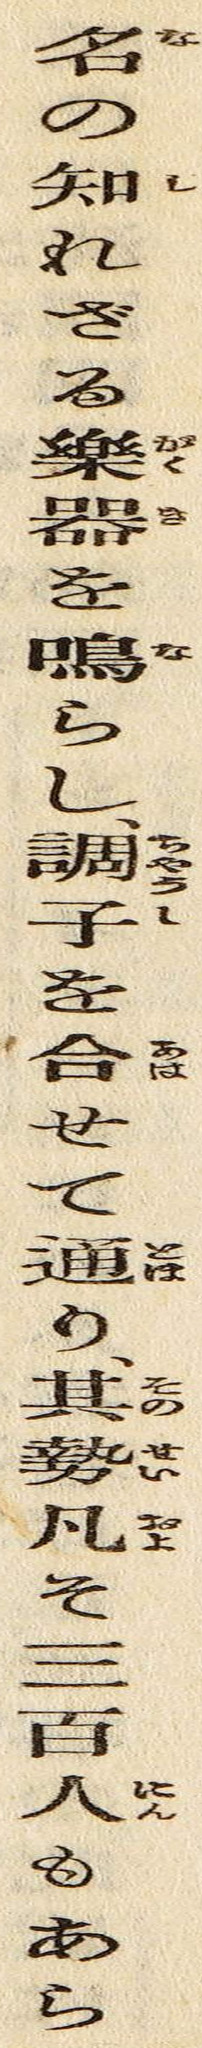名の知れざる楽器を鳴らし、調子を合せて通り、其勢凡そ三百人もあら
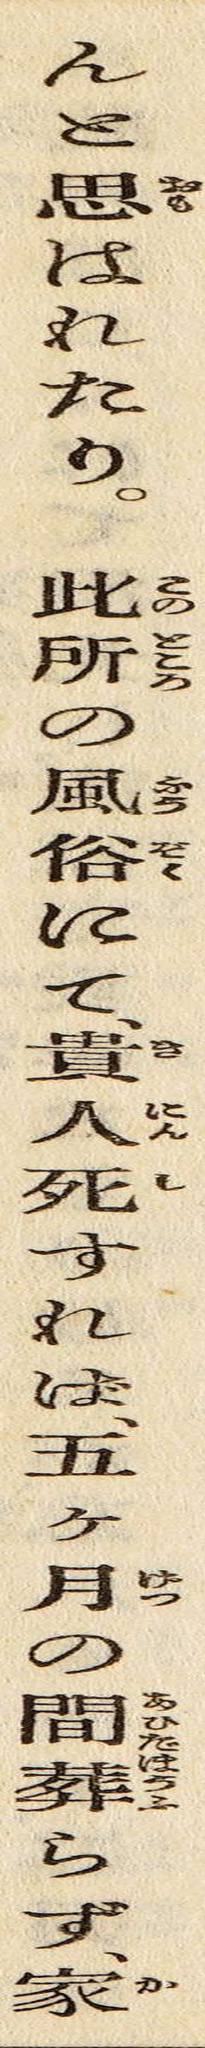んと思はれたり。此所の風俗にて、貴人死すれば、五ケ月の間葬らず、家
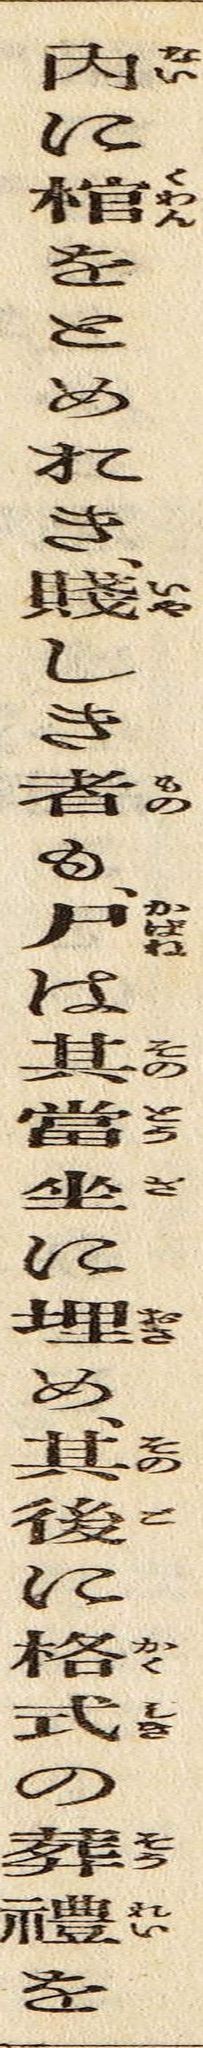内に棺をとめおき、賤しき者も、尸は其当坐に埋め、其後に格式の葬礼を
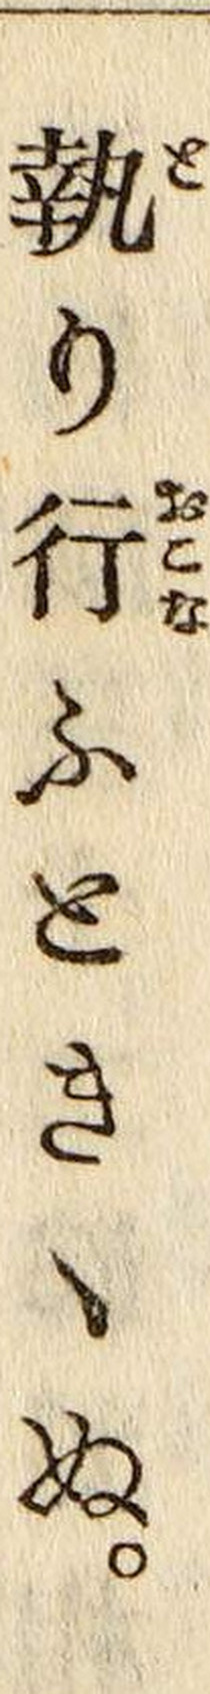執り行ふときヽぬ。
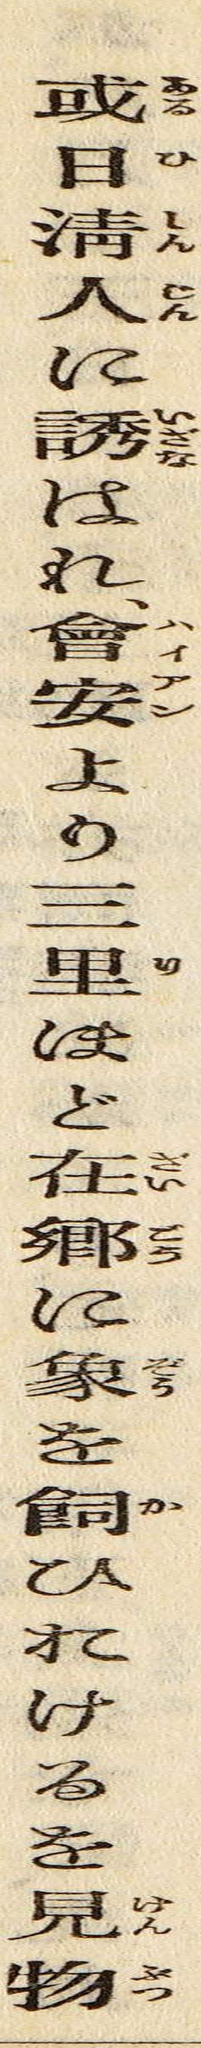或日清人に誘はれ、会安より三里ほど在郷に象を飼ひおけるを見物
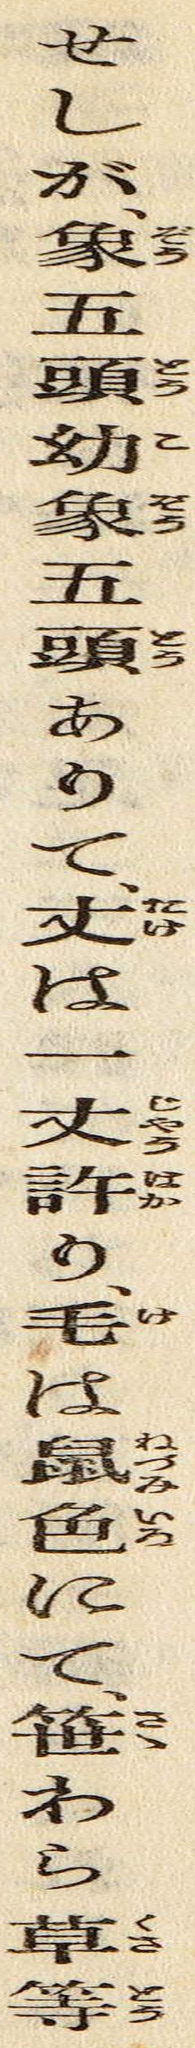せしが、象五頭幼象五頭ありて、丈は一丈許り、毛は鼠色にて、笹わら草等
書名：日本漂流譚
